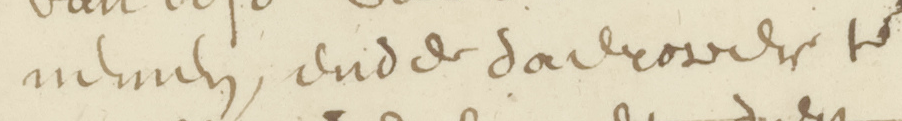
nemen, ende daerover te
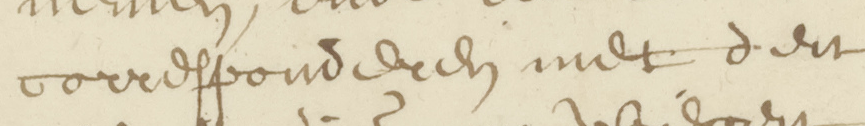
corresponderen met den
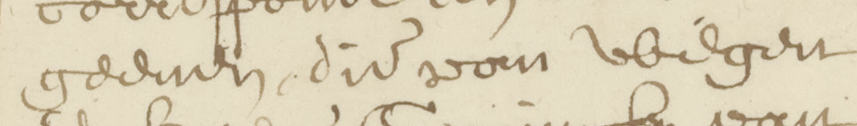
geenen, die van wegen
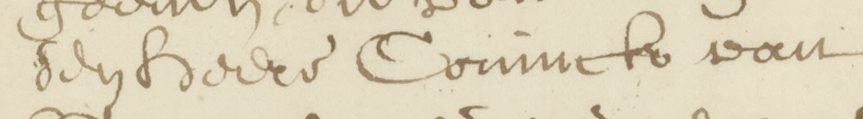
den Heere Coninck van
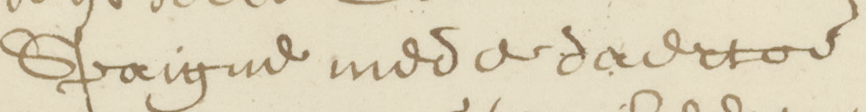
Spaigne mede daertoe
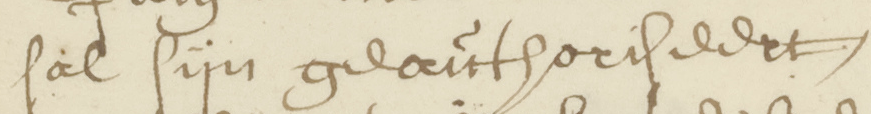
sal sijn geauthoriseert,
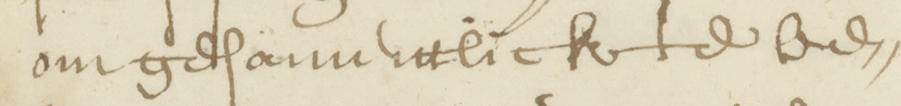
om gesamentlick te be„
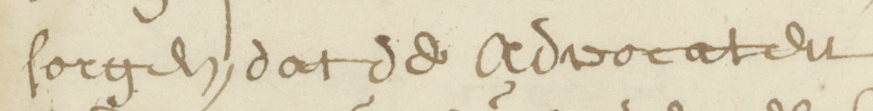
sorgen, dat de advocaten
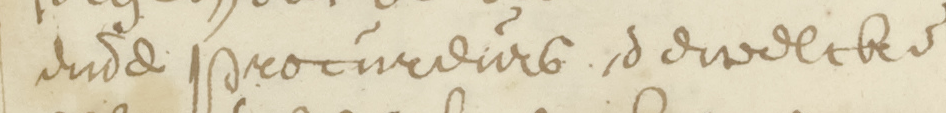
ende Procureurs, dewelcke
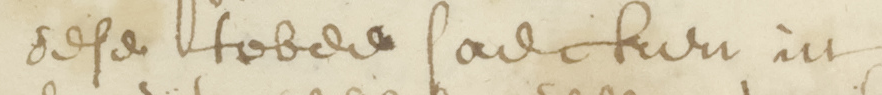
dese twee saecken in
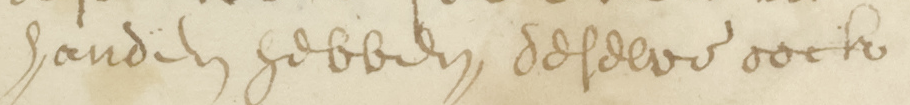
handen hebben, deselve oock
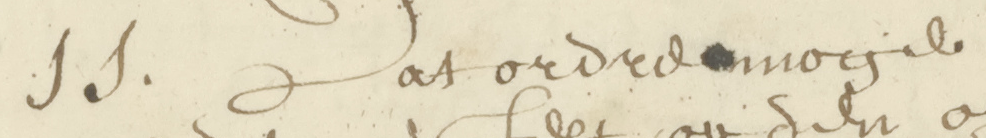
11. Dat ordre moge
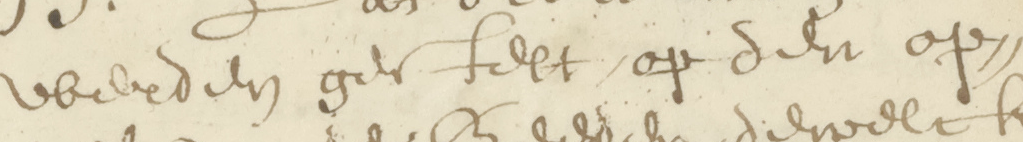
werden gestelt, op den op„
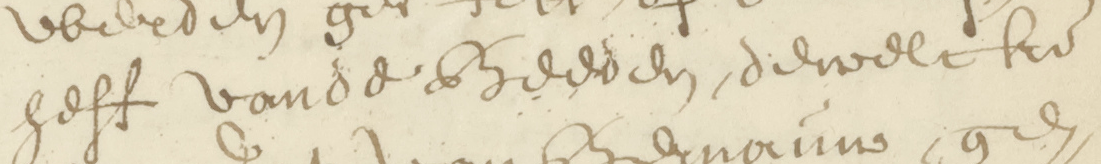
heff vande Beeden, dewelcke
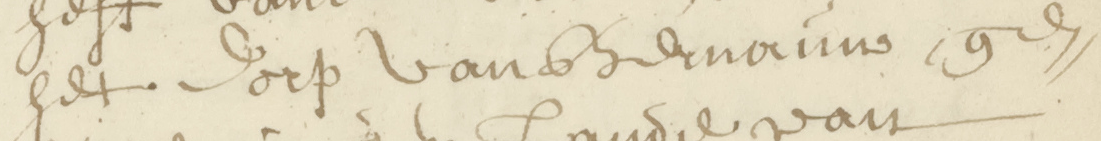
het dorp van Bernauw, ge,,
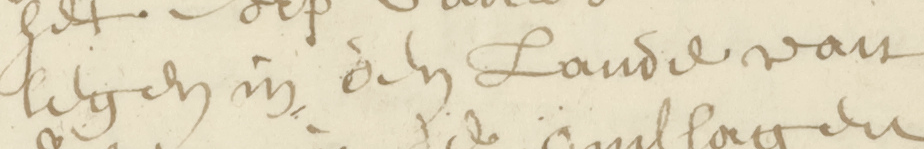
legen in den Lande van
